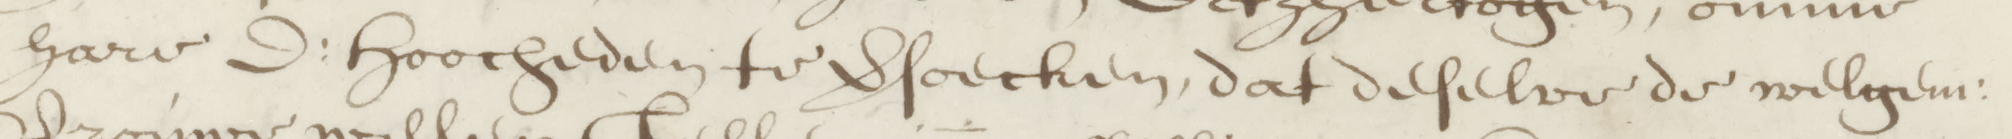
hare D:Hoocheden te vsoecken, dat deselve de welgem:
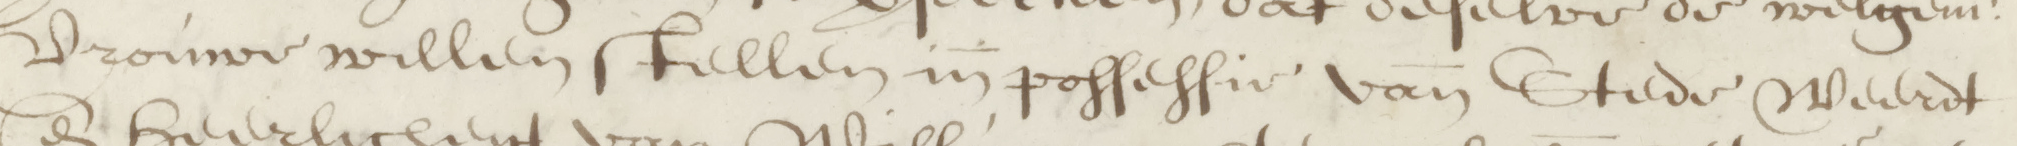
Vrouwe willen stellen in possessie van Stede Weerdt
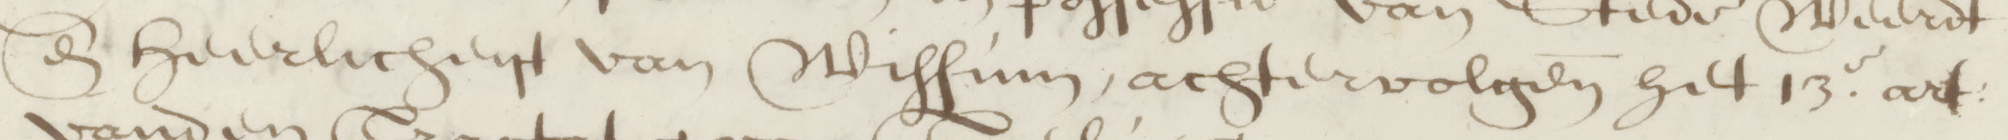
& heerlicheijt van Wissum, achtervolgen het 13e art:
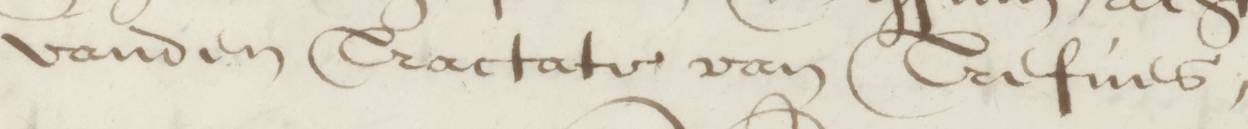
vanden Tractate van Trefues,
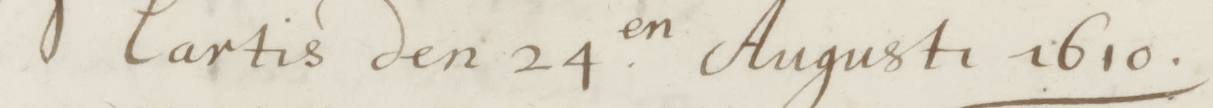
Martis den 24en Augusti 1610.
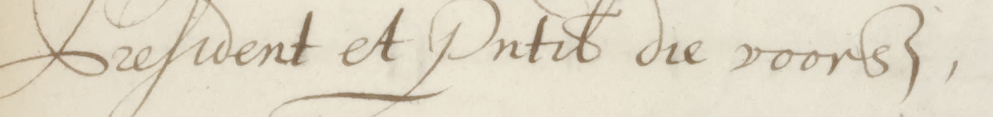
President et Pntib die voors,
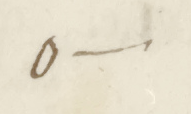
0—
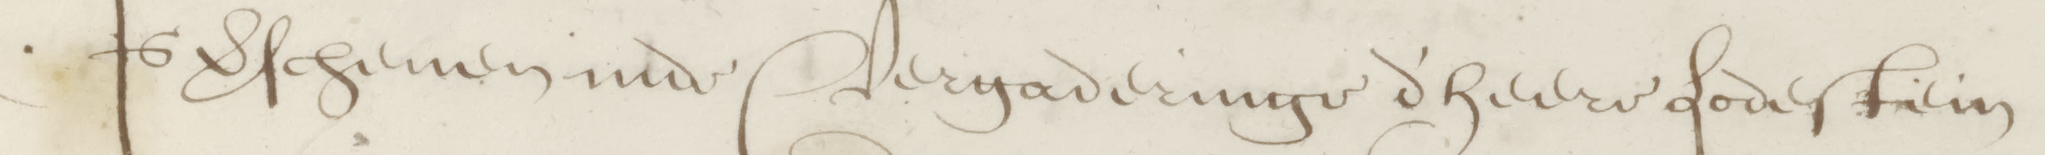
Is vschenen inde Vergaderinge d'heere Lodestein
